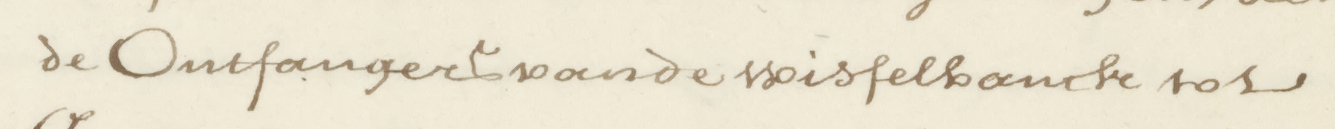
de Ontfangers vande wisselbanck tot
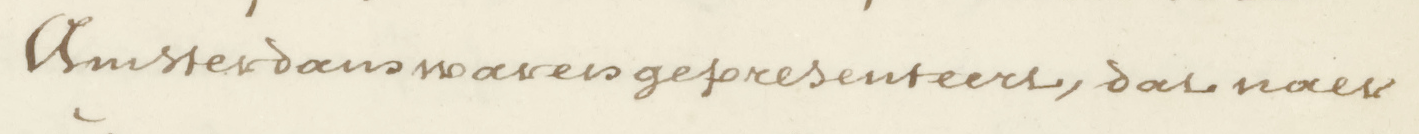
Amsterdam waren gepresenteert, dat naer
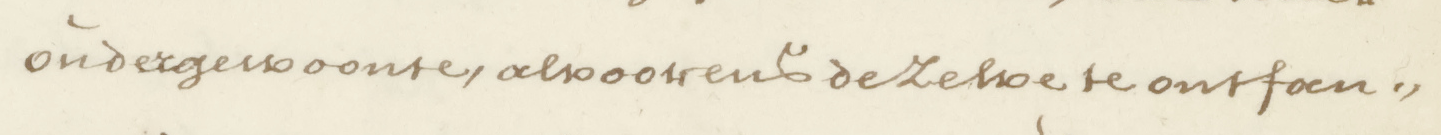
ouder gewoonte, alvoorens dezelve te ontfan„
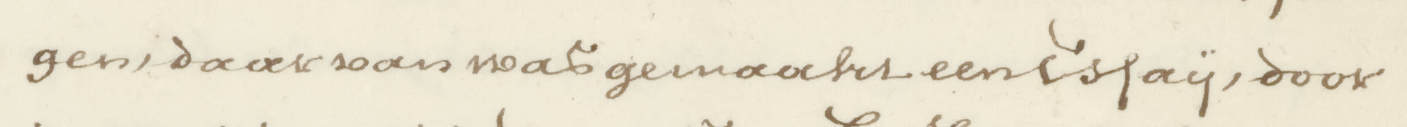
gen, daar van was gemaakt een Essaij, door
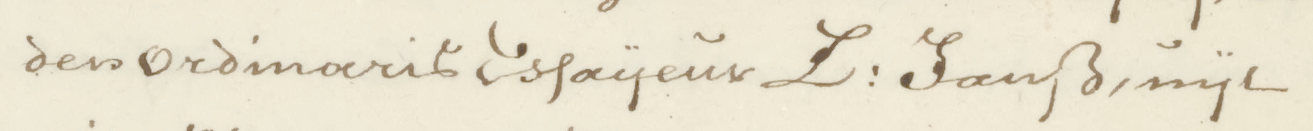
den Ordinaris Essaijeur L: Jansz, uijt
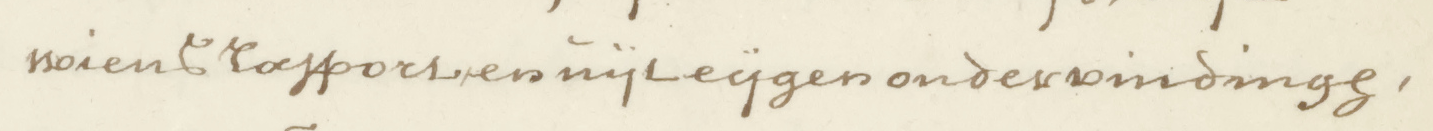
wiens rapport, en uijt eijgen ondervindingh,
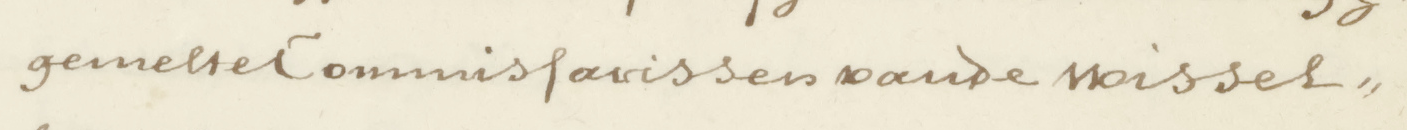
gemelte Commissarissen vande wissel„
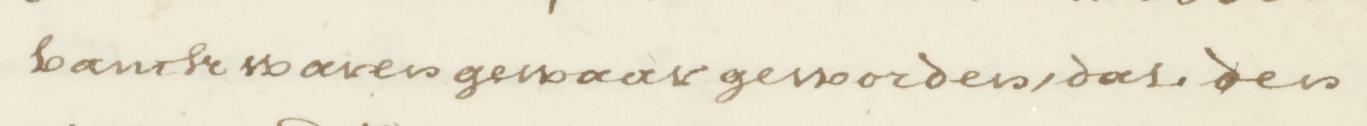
banck waren gewaar geworden, dat den
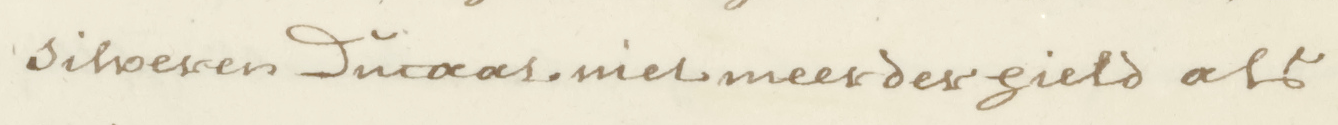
silveren Ducaat niet meerder hield als
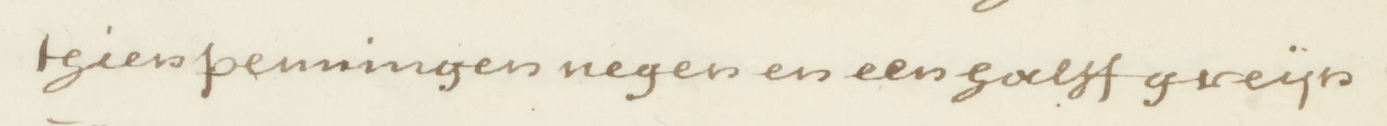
thien penningen negen en een halff greijn
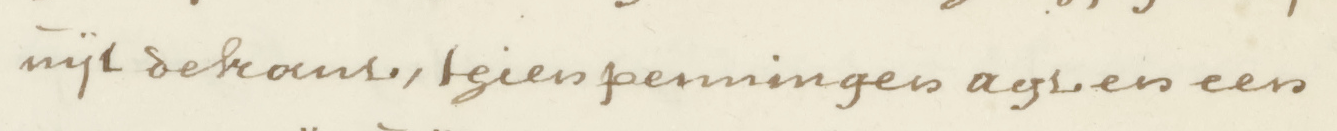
uijt de kant, thien penningen agt en een
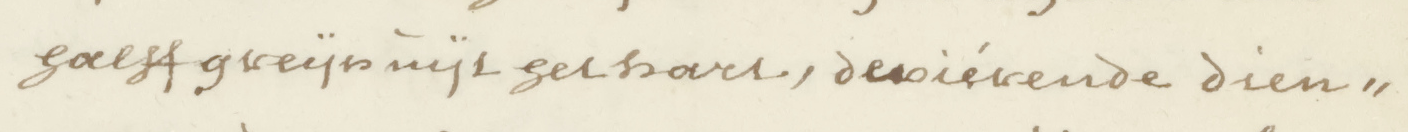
halff greijn uijt het hart, de vier ende dien„
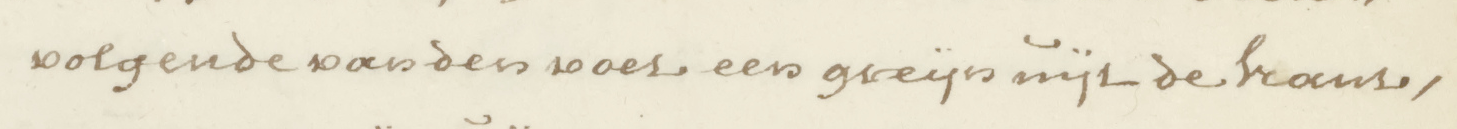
volgende van den voet een greijn uijt de kant,
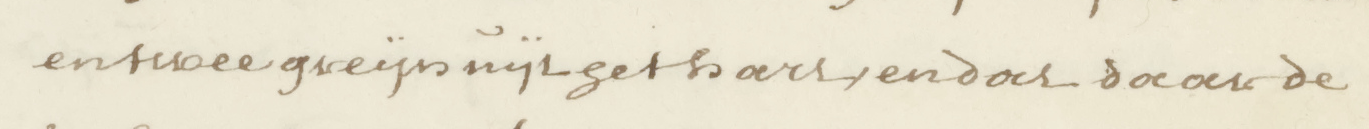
en twee greijn uijt het hart, en dat daar de
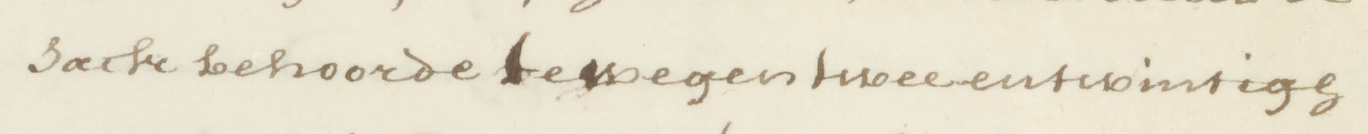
sack behoorde te wegen tweeentwintigh
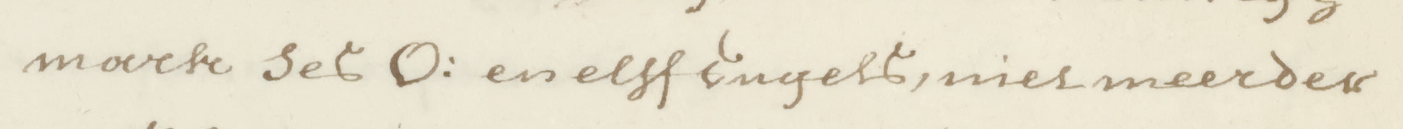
mark ses O: en elff Engels, niet meerder
